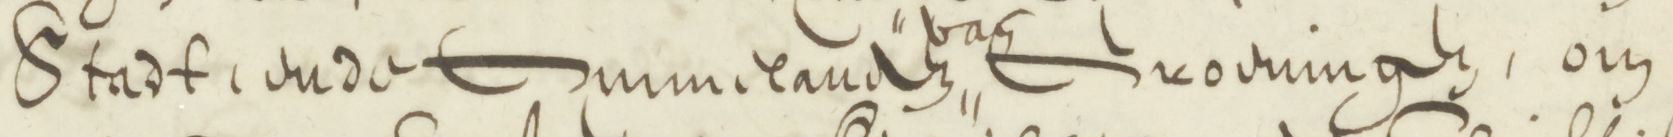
Stadt, ende Ommelanden van Groeningen, om
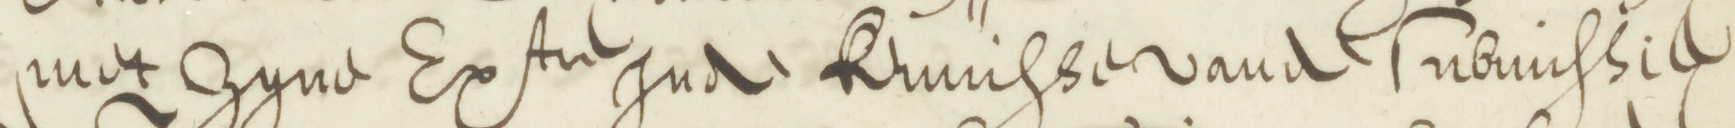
met Zyne Extie inde kennisse vande submissie
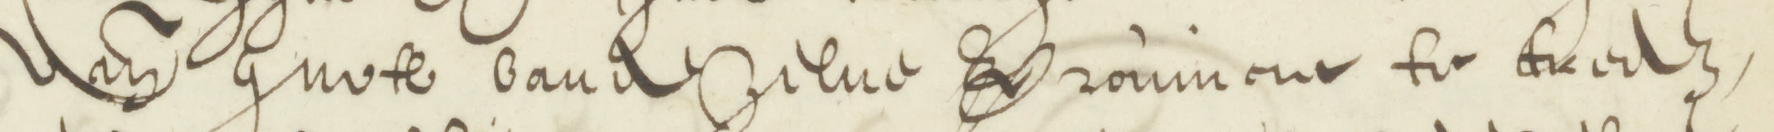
van quote van de zelue Prouincie te treden,
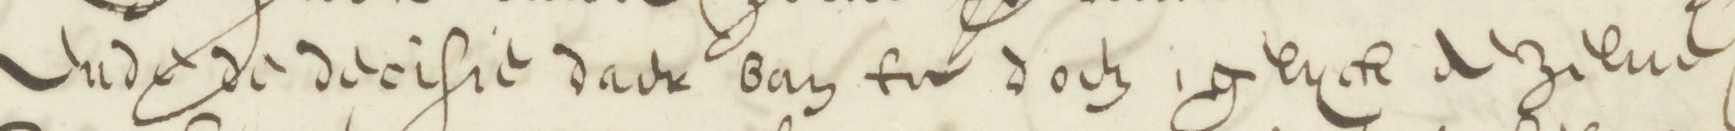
ende de decisie daer van te doen, gelyck dezelue
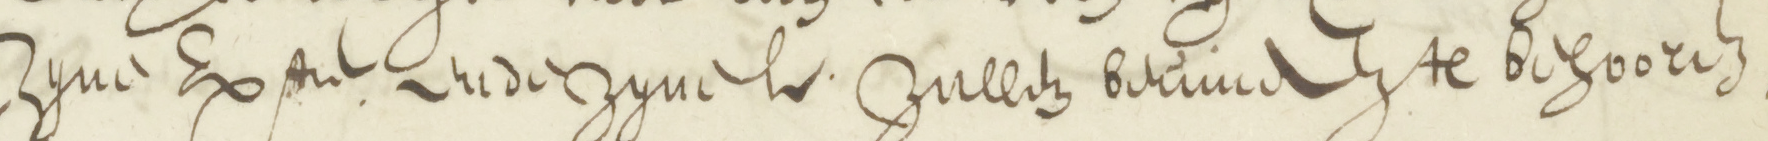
Zyne Extie ende zyne L. zullen beuinden te behooren
